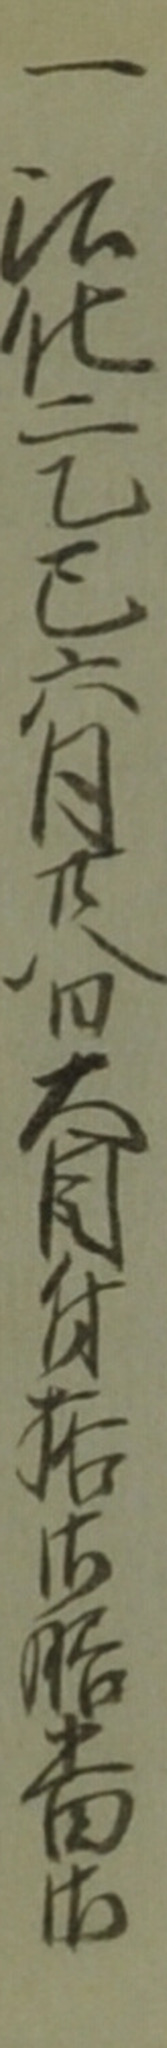一弘化二乙巳六月廿八日大目付格御膳番御
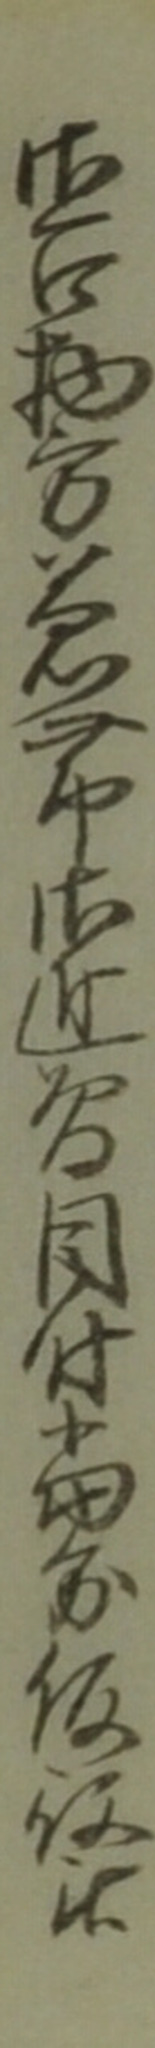御召物方兼帯御近習目付当分仮役被
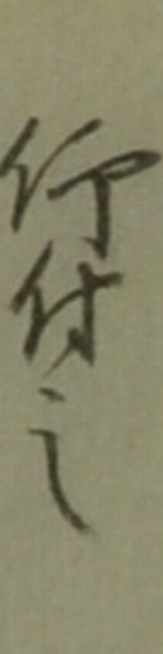仰付之
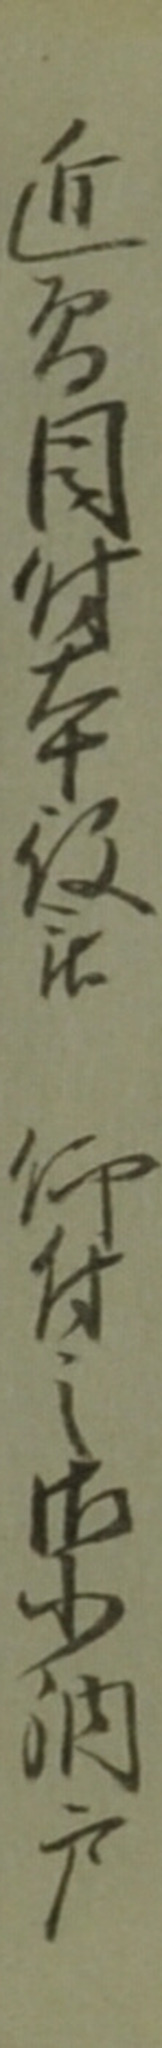近習目付本役被仰付之御小納戸
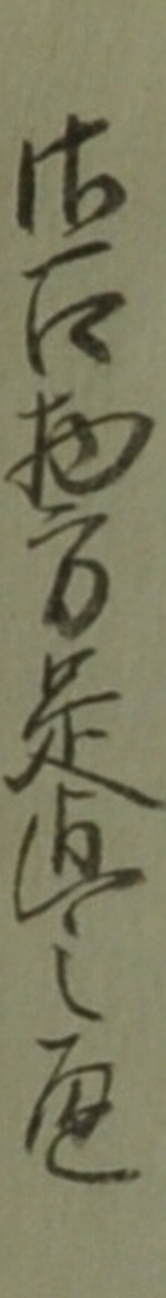御召物方是迄之通

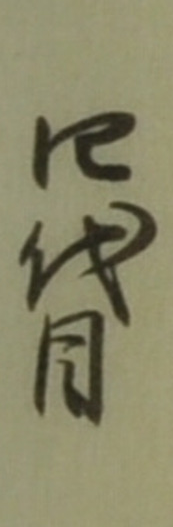四代目
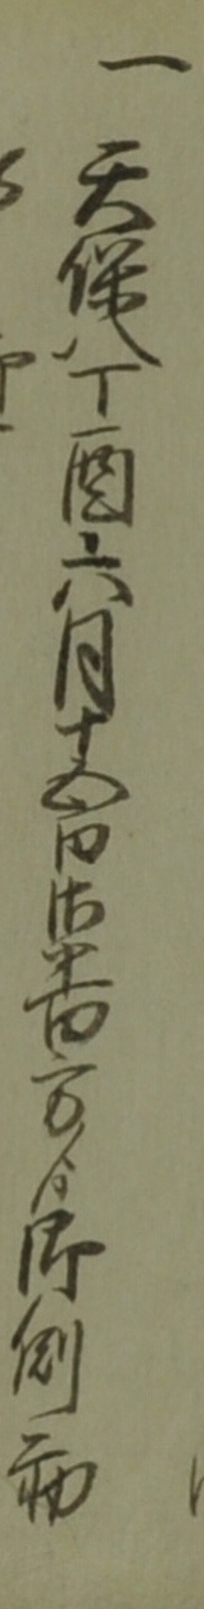一天保八丁酉六月十五日御番方ゟ御側勤
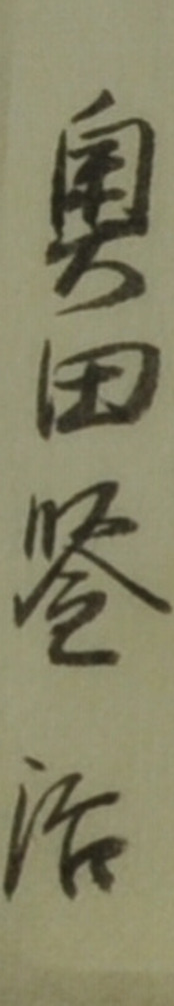奥田鍳治
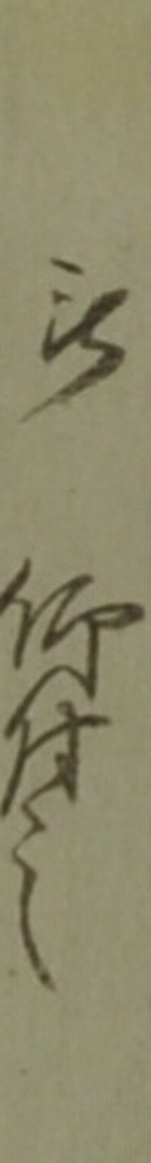被仰付之
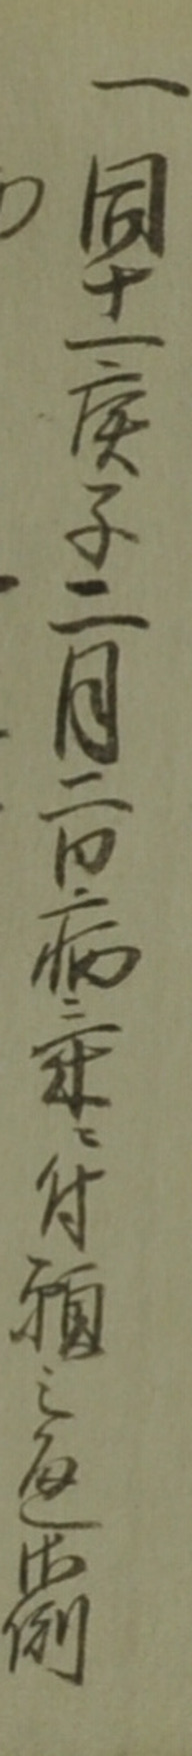一同十一庚子二月二日病気ニ付願之通御側
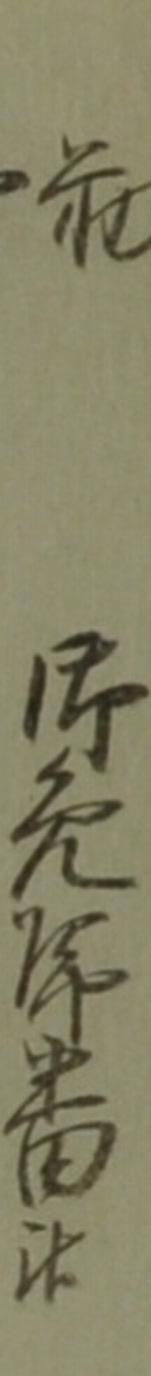勤御免帰番被
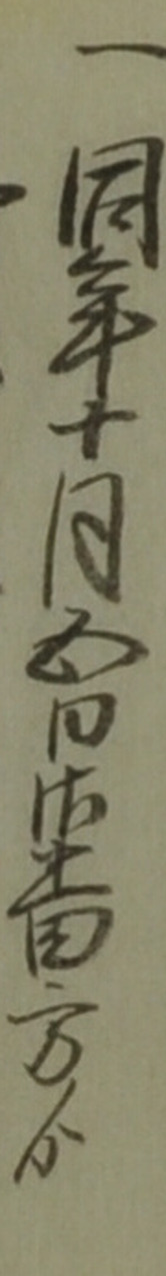一同年十月五日御番方ゟ
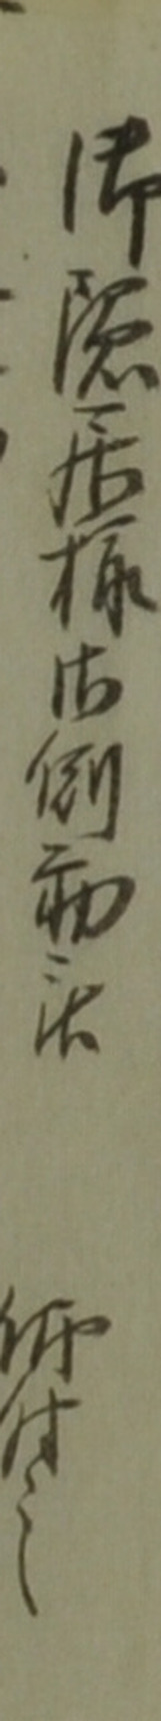御隠居様御側勤被仰付之
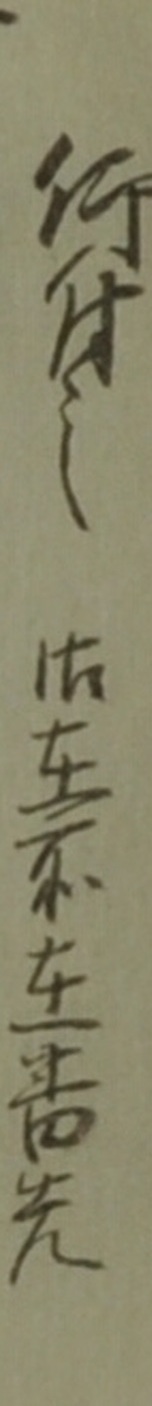仰付之御在所在番先
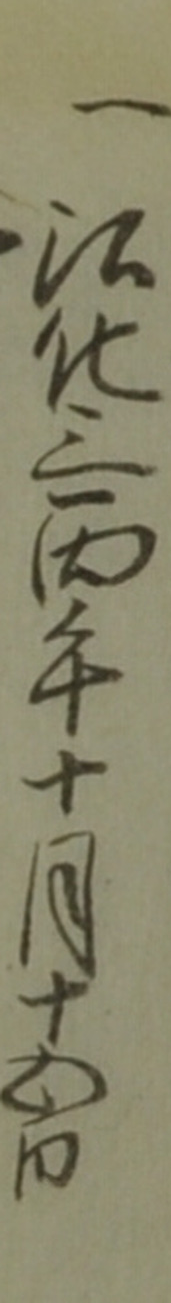一弘化三丙午十月十五日
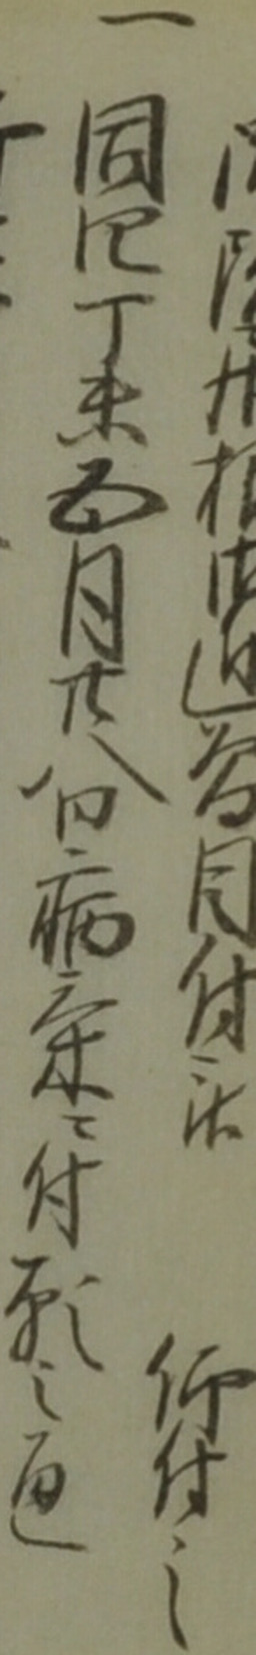一同四丁未五月廿八日病気ニ付願之通
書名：諸御役代々録（五）
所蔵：伊那市立高遠町図書館・合同会社AMANE
